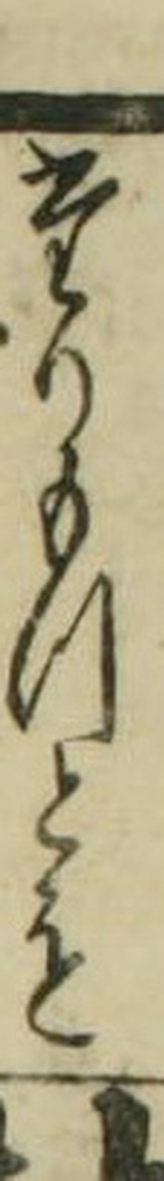たりもつとも
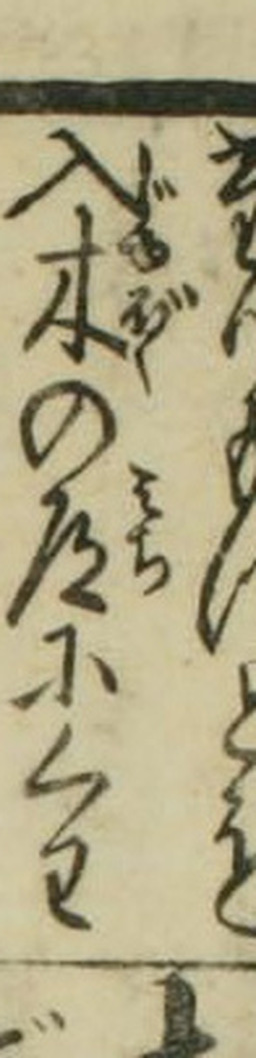入木の道にくわ
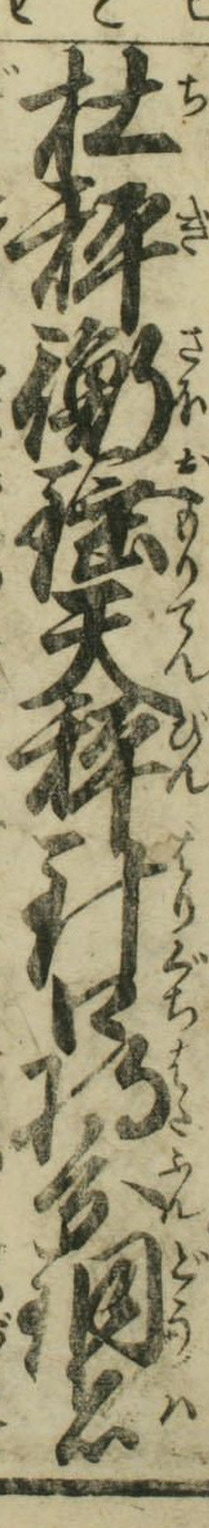杜秤衡錘天秤針口将分銅者
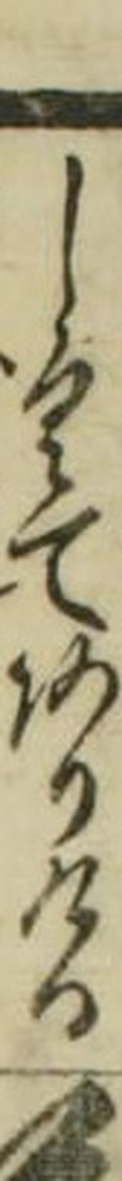しくてありける
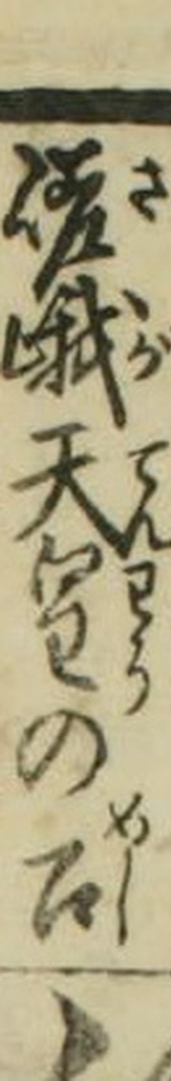嵯峨天皇の召
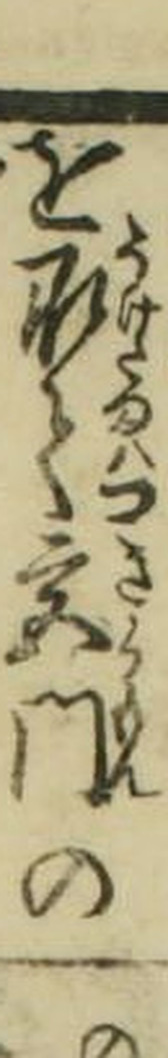を承て宮門の
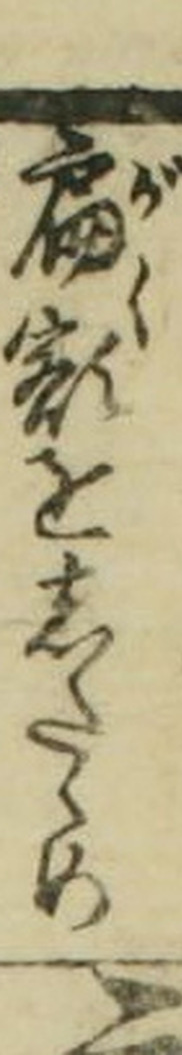扁額をしたゝめ
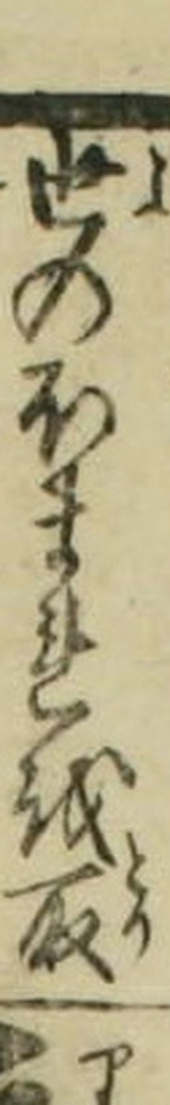世のほまれを取
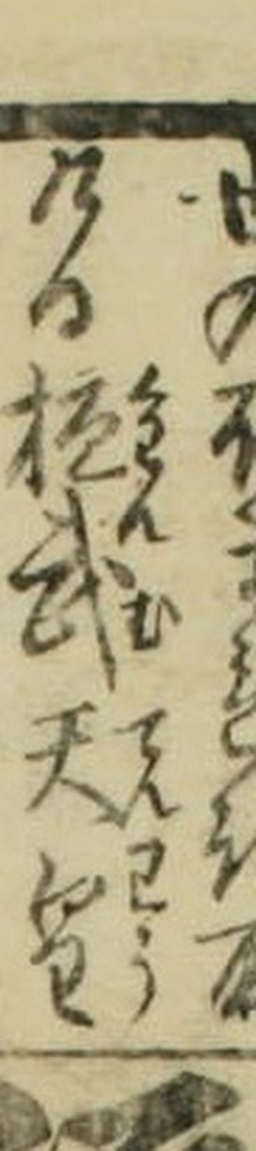ける桓武天皇
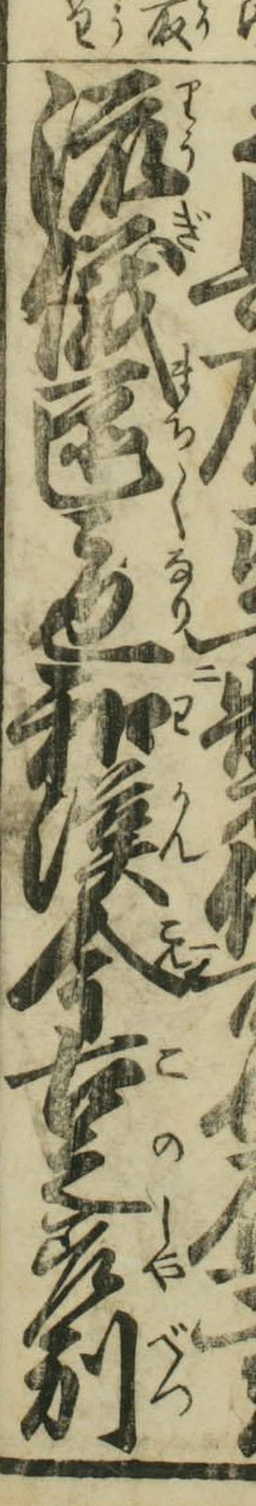流儀區々也和漢今古之差別
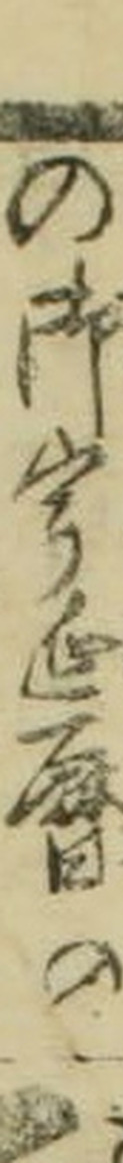の御宇延暦の
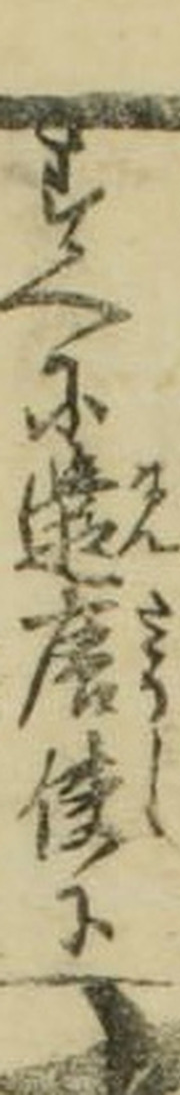すへに遣唐使に
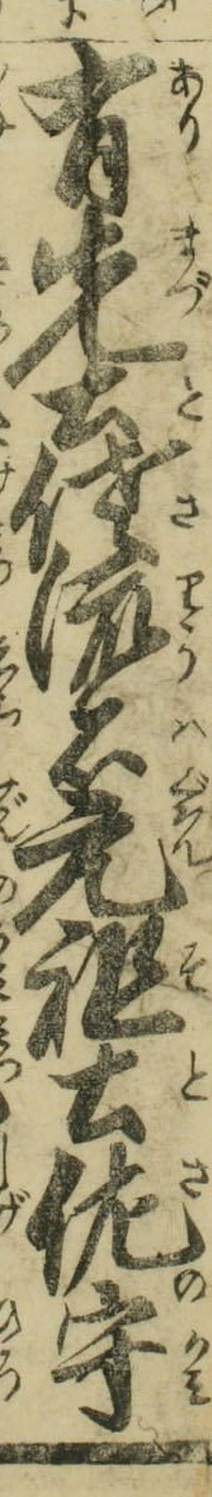有先土佐流者元祖土佐守
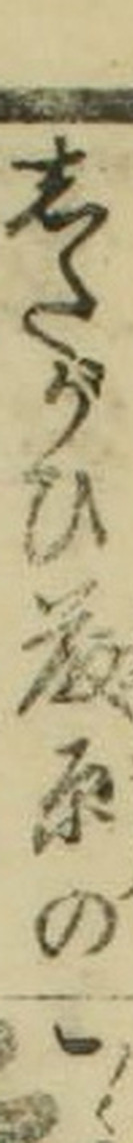したがひ藤原の
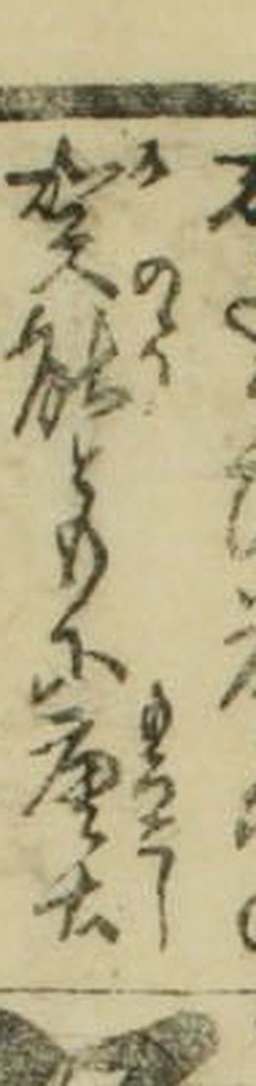賀能ともに唐土
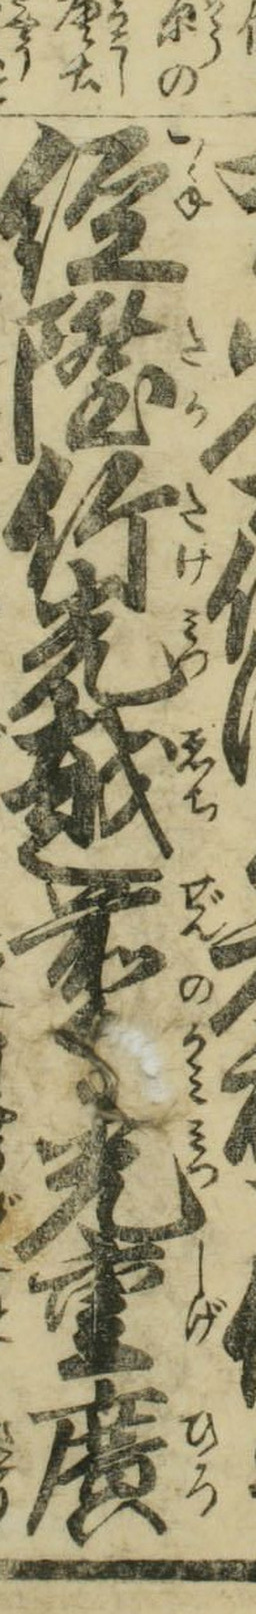経隆竹光越前守光重廣
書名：増補職人往来
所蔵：東京学芸大学教育コンテンツアーカイブ
